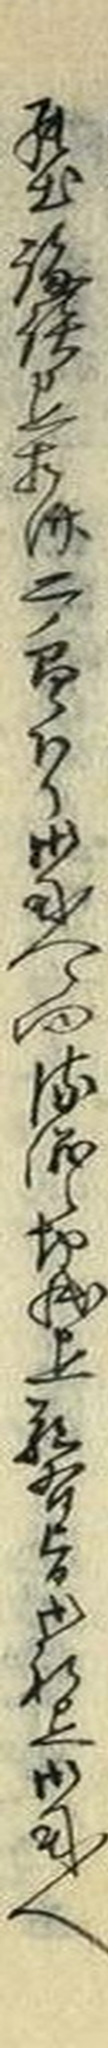罷出講談申上相済二之間へ下り御用人へ向流儀之切紙申上罷有旨御礼申上御用人
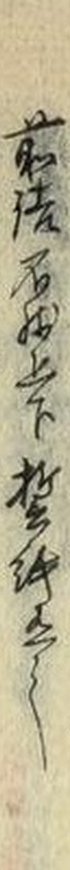前詰不残上下誓紙有之
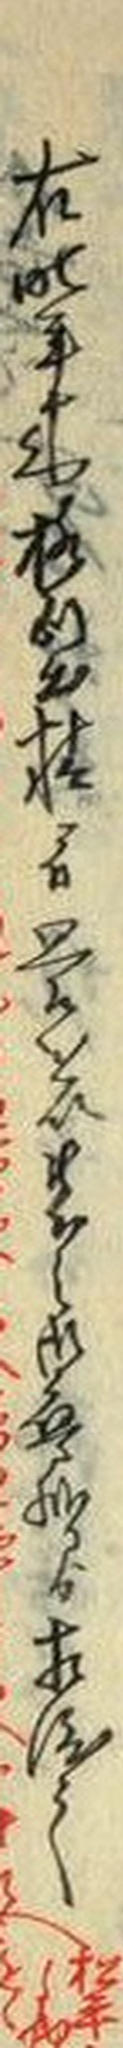右昨年来格別出精ニ付思召を以被下之御鷹掛りゟ相渡之
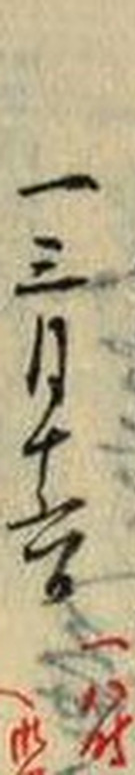一三月十六日

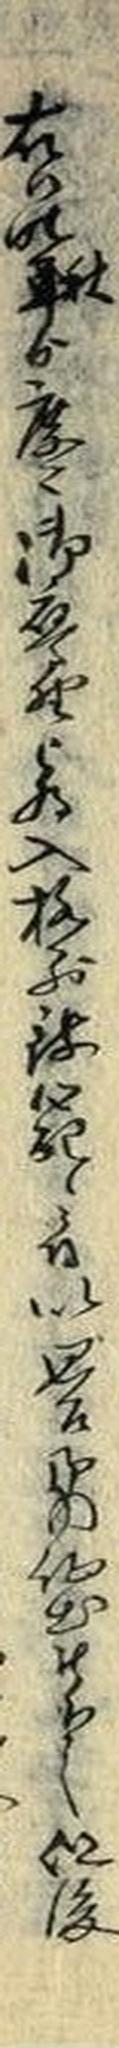右ハ此秋ゟ度々御鷹野被為入格別致心配候ニ付以思召御内証出被下之但後
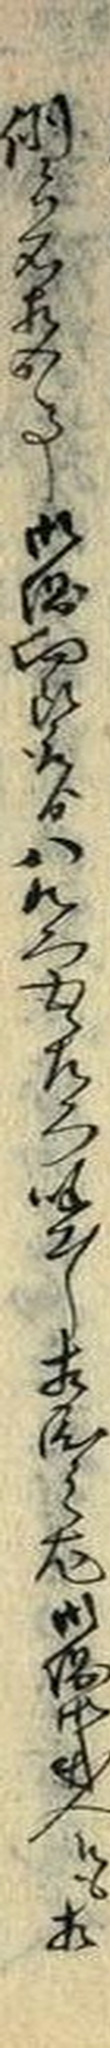例ニハ不相成候事御側向御頭取ゟ八左衛門五郎左衛門呼出相渡之尤御側御用人江も相
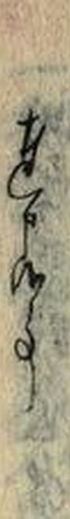達申候事
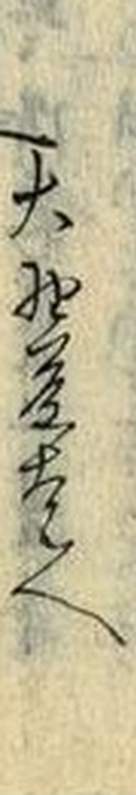大野藤太夫
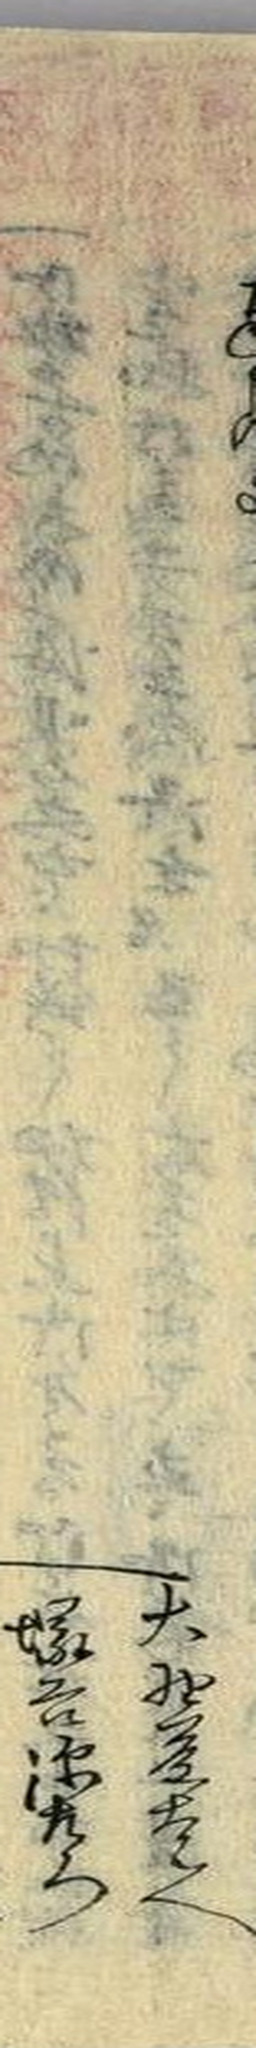塚谷源左衛門
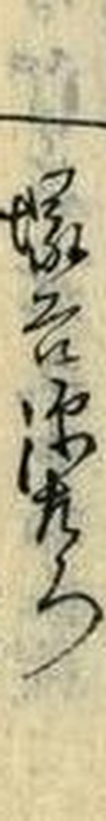塚谷源左衛門
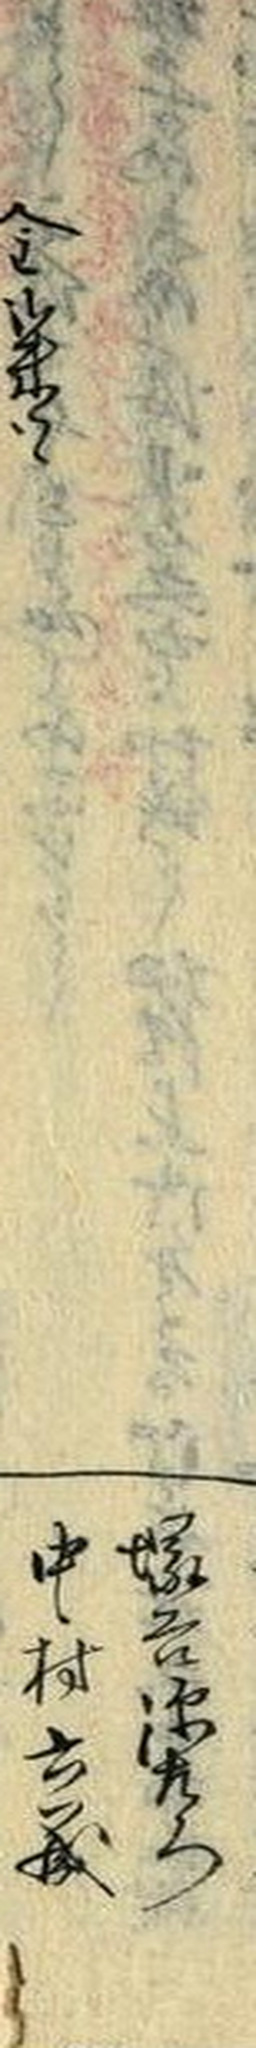金弐朱ツゝ中村六蔵
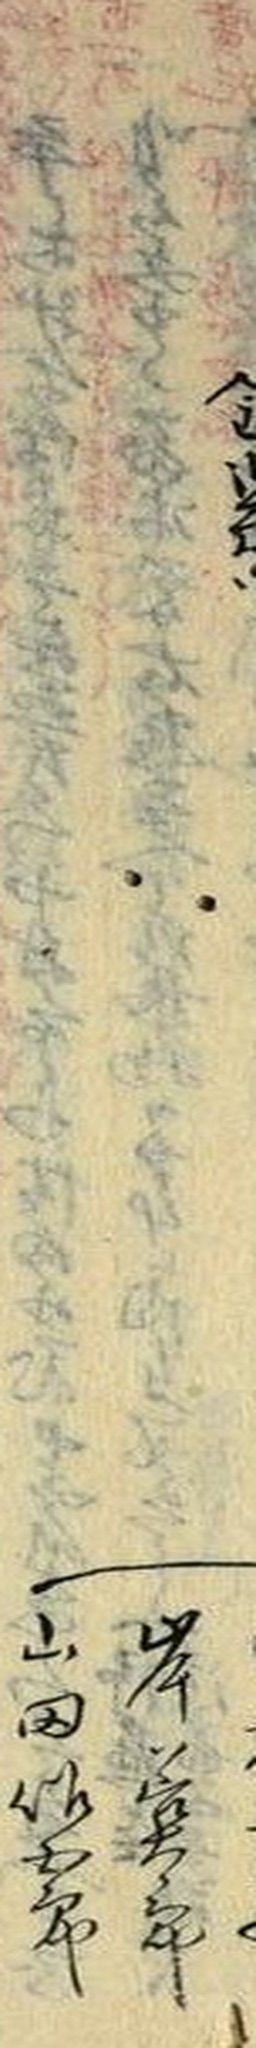山田作五郎
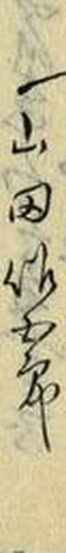山田作五郎
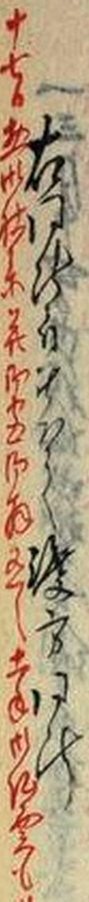右同断ニ付被下之渡方同断
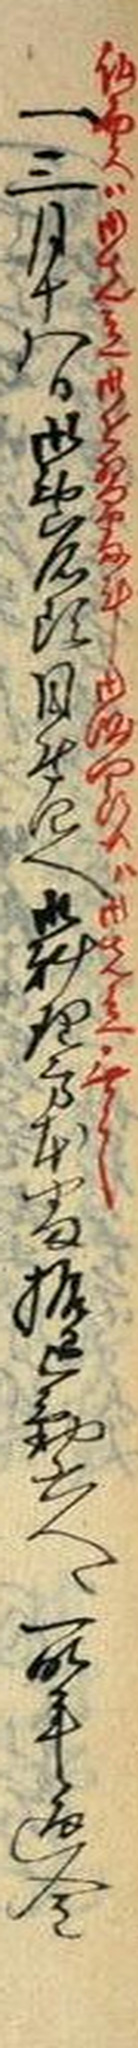一三月十八日御台所頭目付四人御料理方本番振退勤六人へ一昨年之通金
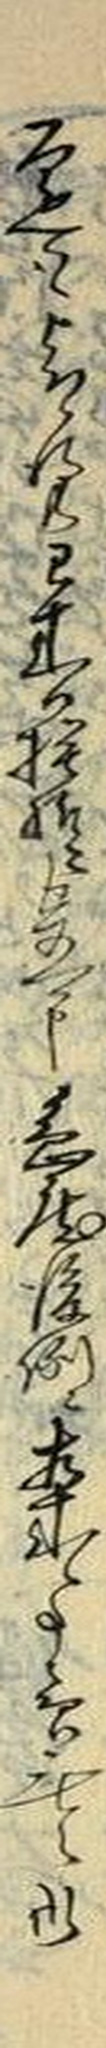百疋ツゝ被下候得共已来模様ニ寄可申ニ而急度後例ニ相成候事ニ而ハ無之御
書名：少傅日録抄（斉承付側向頭取日記、在国）
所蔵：福井県文書館 Fukui Prefectural Archives
